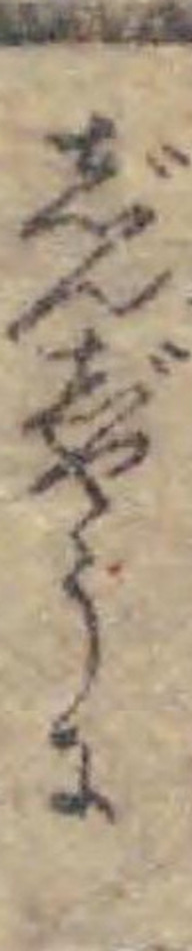じんじやうに
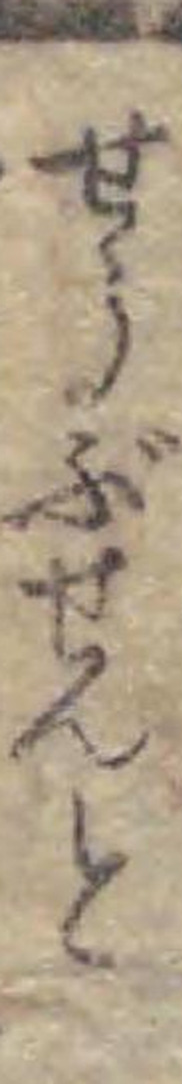せいぶせんと
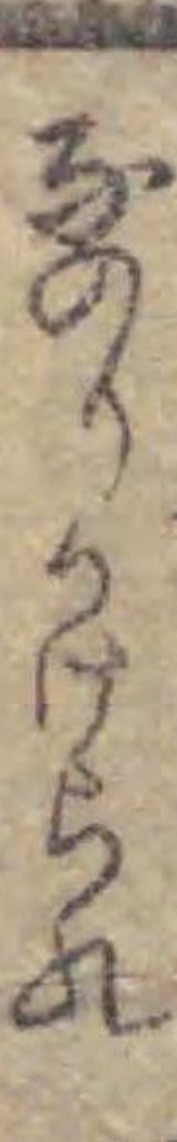なのりかけられ
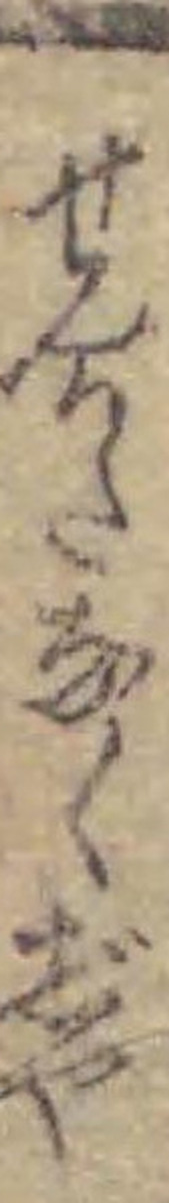せんかたなくじや
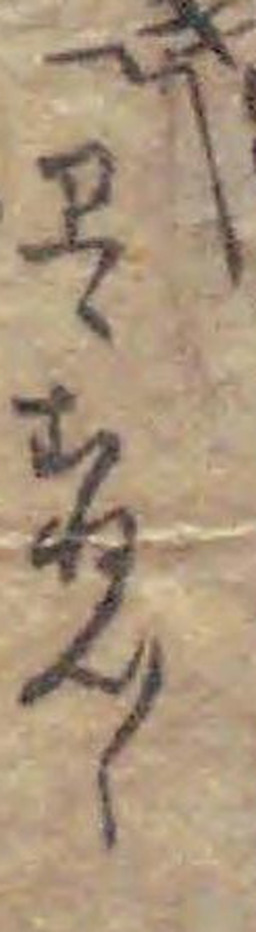〽ヱヽむねん〳〵
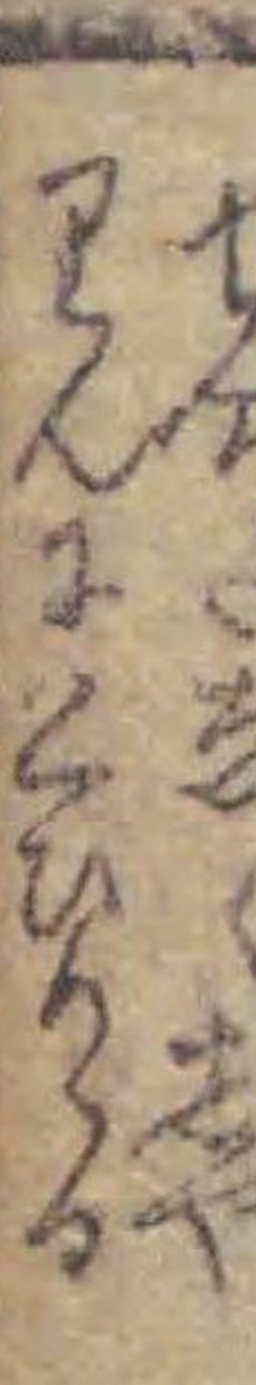りんにくひかゝる
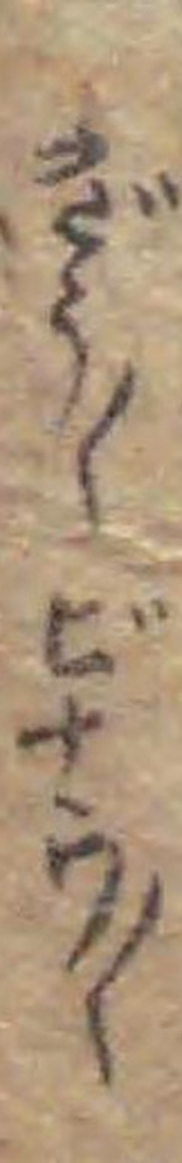ぎう〳〵ビナウ〳〵
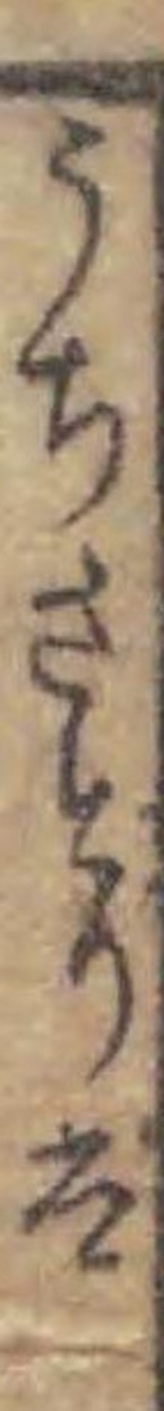うちさとりは
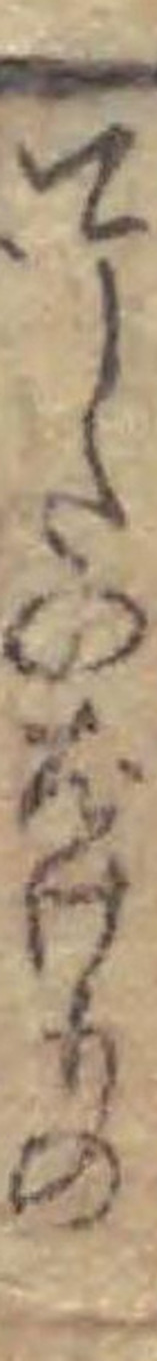てしたのばけもの
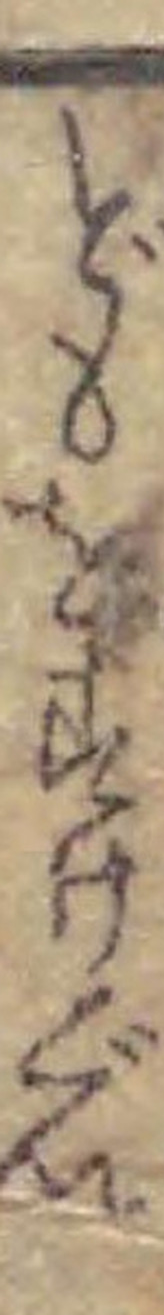どもをすけぐい
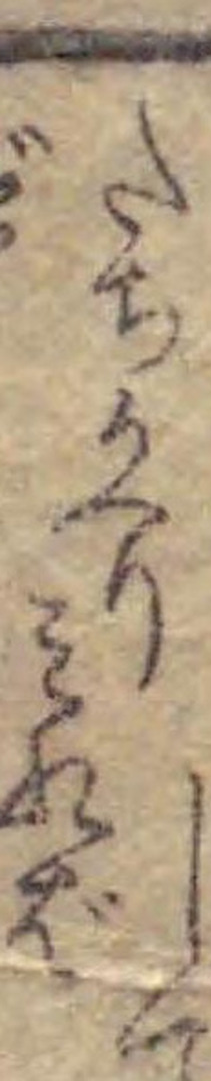たちかへりみれば
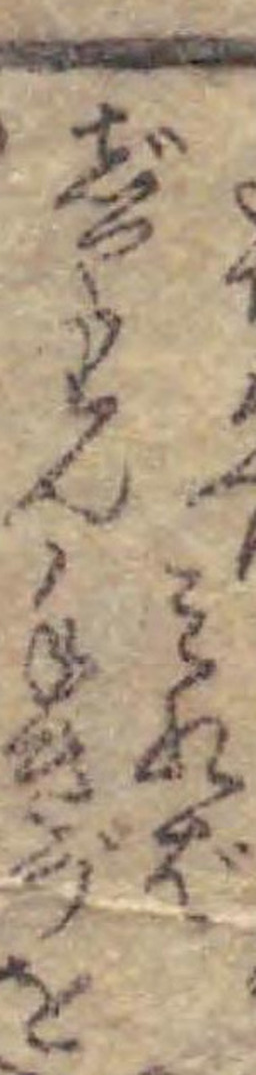じやりんてきづを
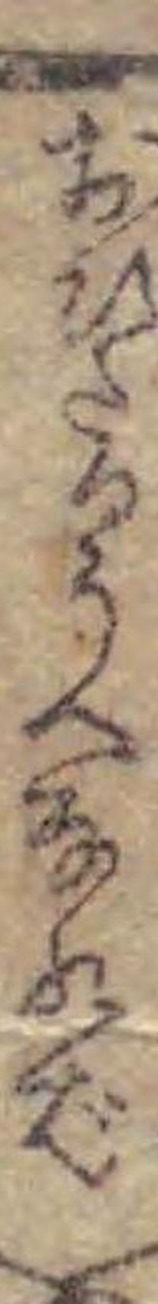おひたるうへなれば
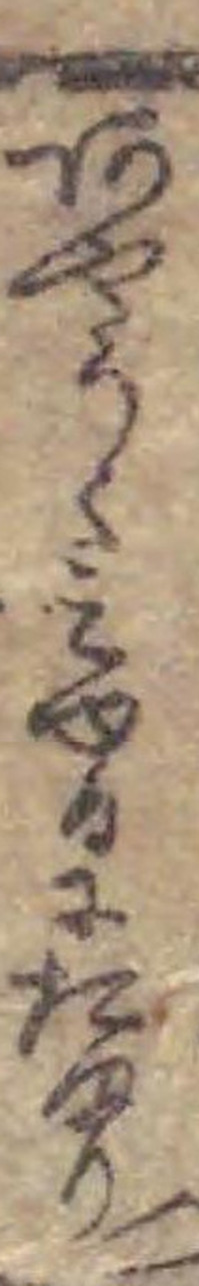あうあうくみやるにたまり
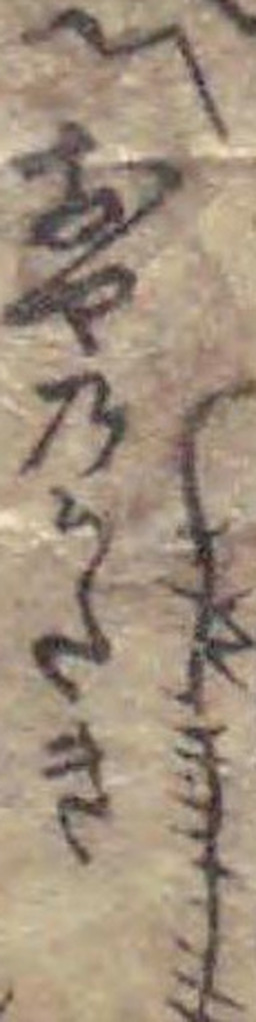おやのかたき
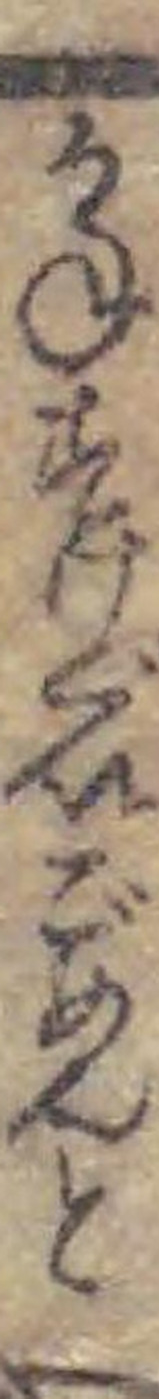かねすけぐいごめんと
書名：化物世界夜半嵐 : 3巻
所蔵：国立国会図書館 National Diet Library, JAPAN
